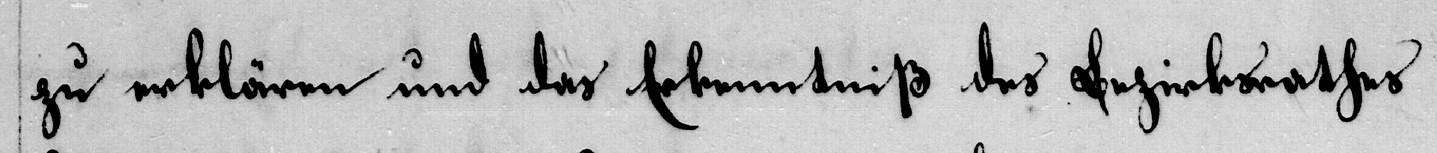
zu erklären und das Erkenntniß des Bezirksrathes
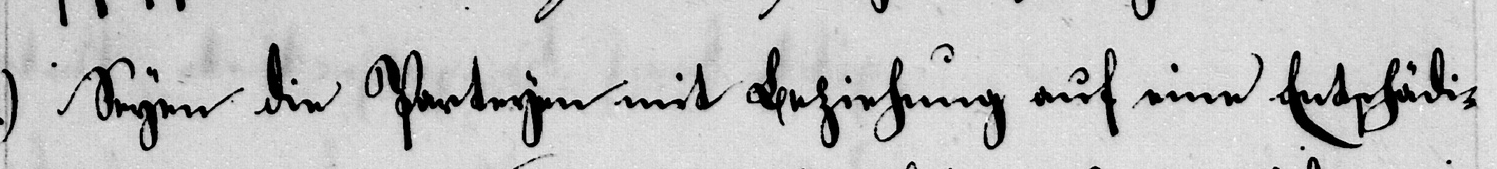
Seyen die Parteyen mit Beziehung auf eine Entschädi¬
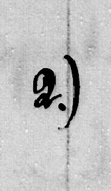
2.)
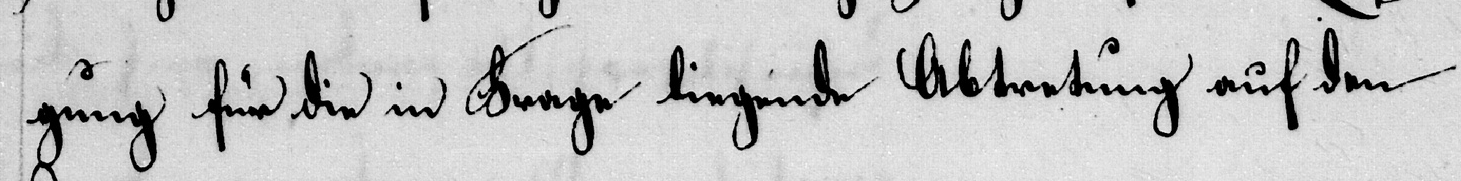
gung für die in Frage liegende Abtretung auf den
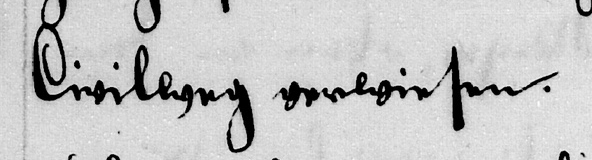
Civilweg verwiesen.
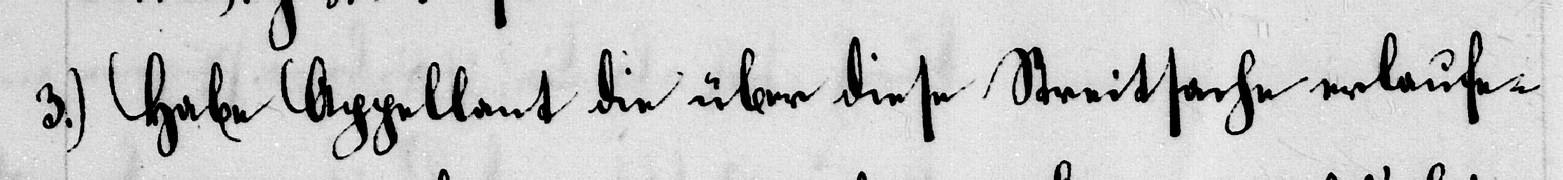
3.) Habe Appellant die über diese Streitsache erlaufe¬
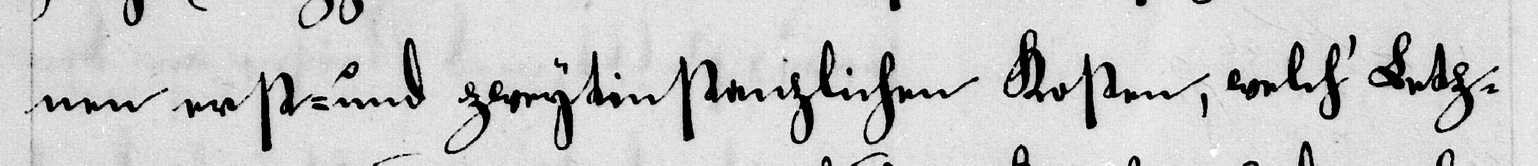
nen erst- und zweytinstanzlichen Kosten, welch’ Letz¬
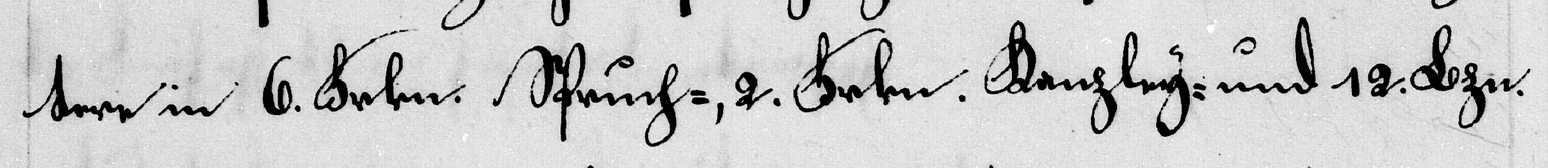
tere in 6. Frkn. Spruch-, 2. Frkn. Kanzley- und 12. Bzn.
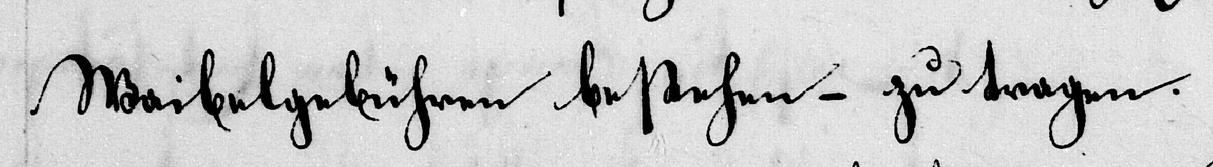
Waibelgebühren bestehen – zu tragen.
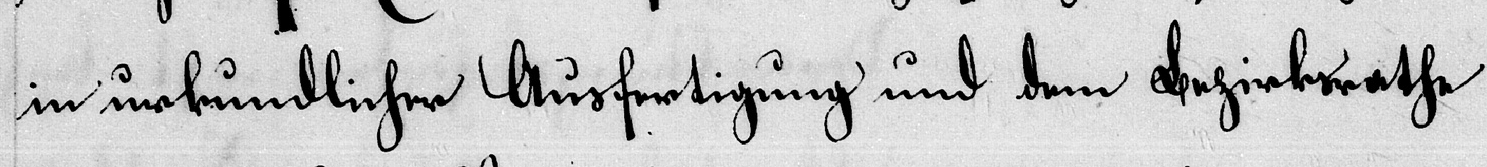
n urkundlicher Ausfertigung und dem Bezirksrathe
